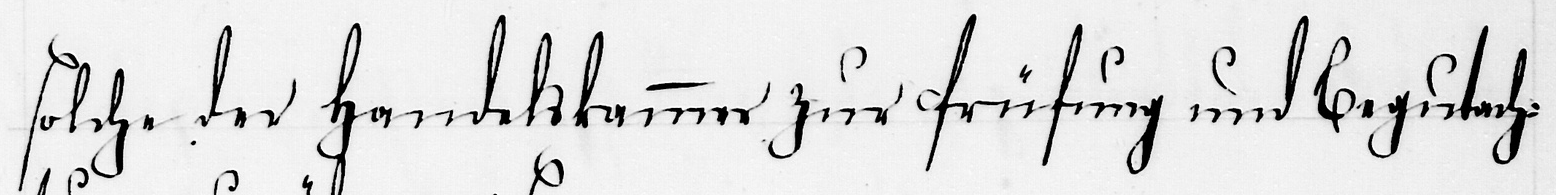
solche der Handelskammer zur Prüfung und Begutac¬
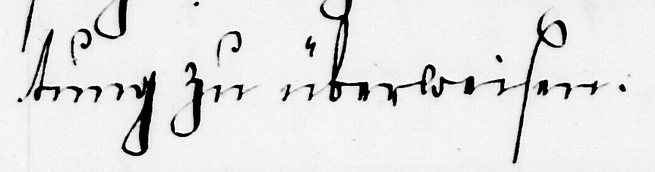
htung zu überweisen.
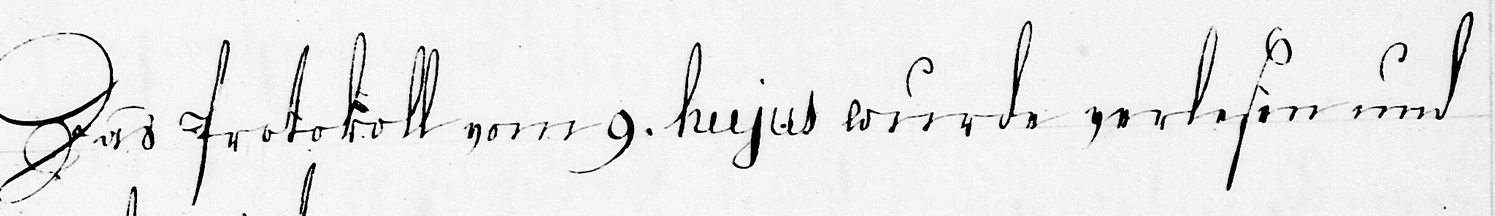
Das Protokoll vom 9. hujus wurde verlesen und
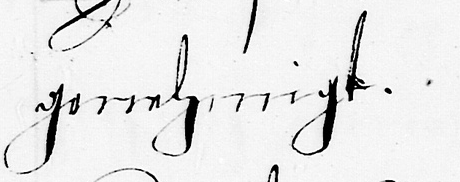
genehmigt.
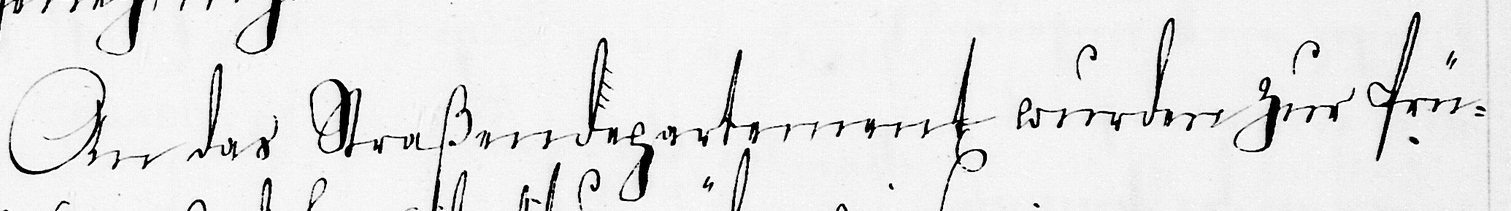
An das Straßendepartement wurden zur Prü¬
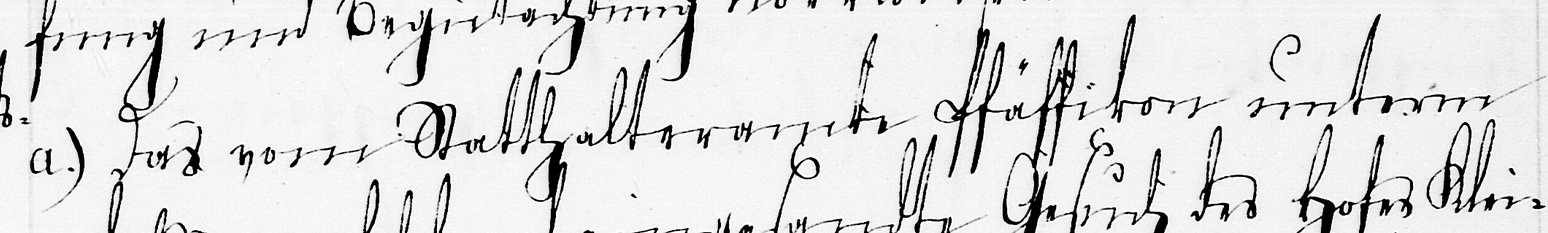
a.) Das vom Statthalteramte Pfäffikon unterm
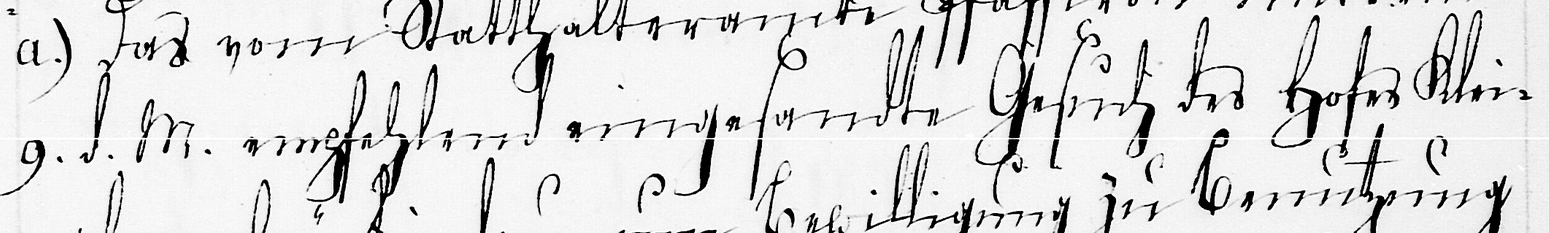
9. d. M. empfehlend eingesandte Gesuch des Hofes Klei¬
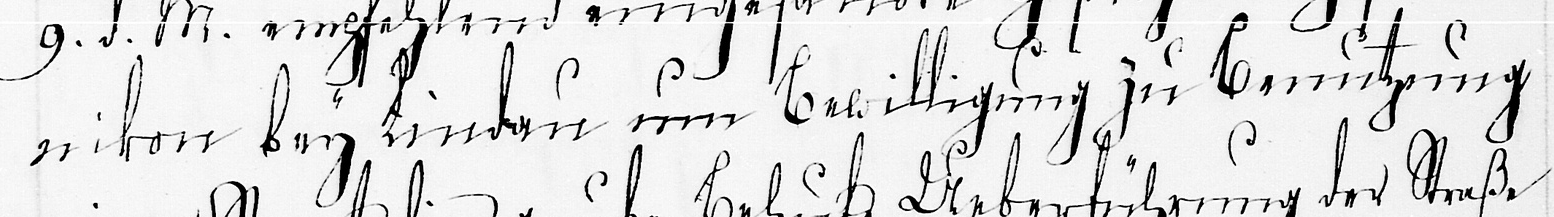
nikon bey Lindau um Bewilligung zu Benutzung
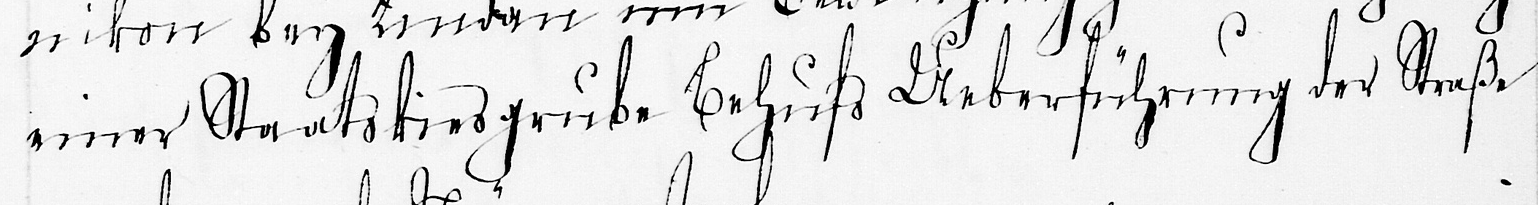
einer Staatskiesgrube Behufs Ueberführung der Straße
